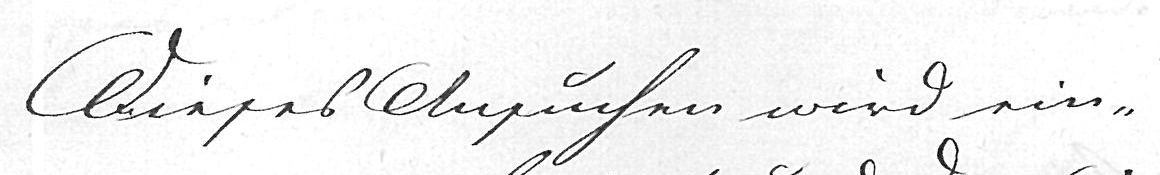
Dieses Ansuchen wird ein-
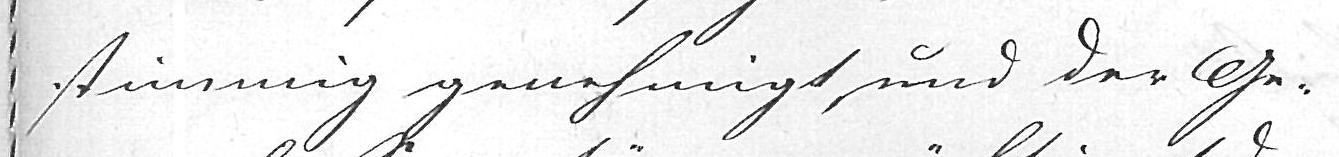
stimmig genehmigt, und der Ge-
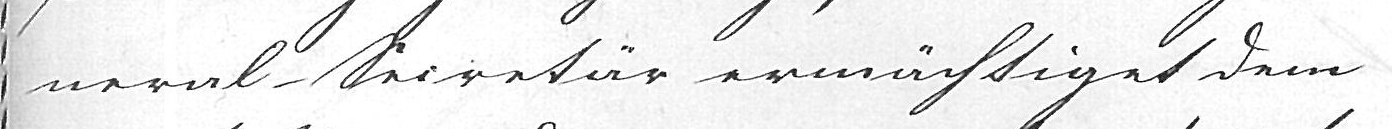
neral-Secretär ermächtiget dem
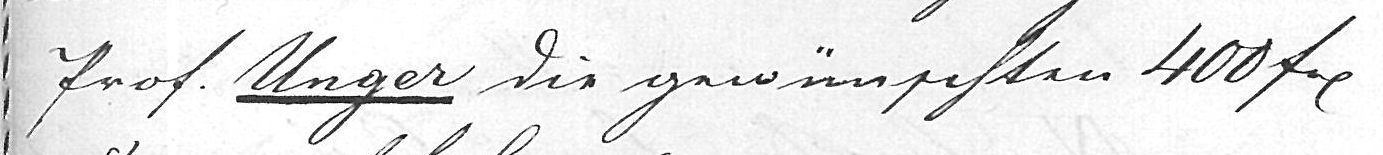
Prof. Unger die gewünschten 400 fl
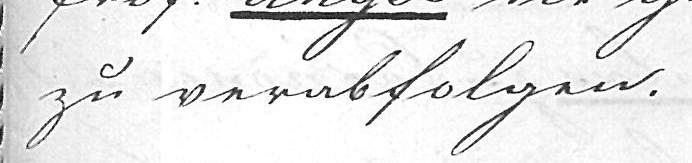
zu verabfolgen.
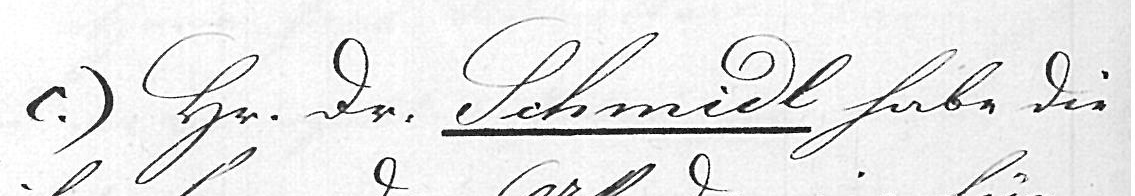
c.) Hr. Dr. Schmidl habe die
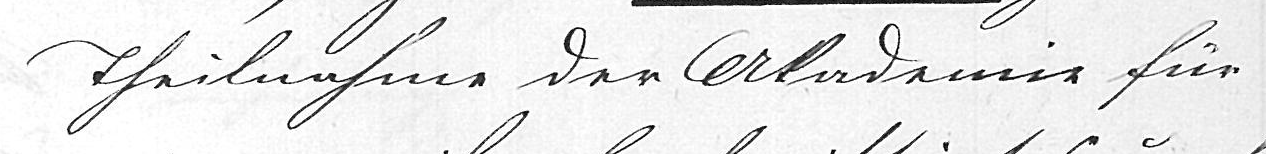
Theilnahme der Akademie für
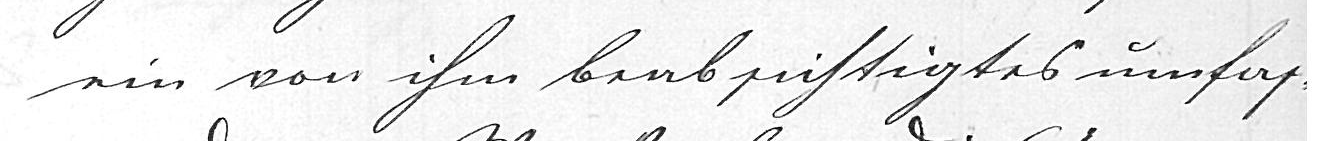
ein von ihm beabsichtigtes unfas-
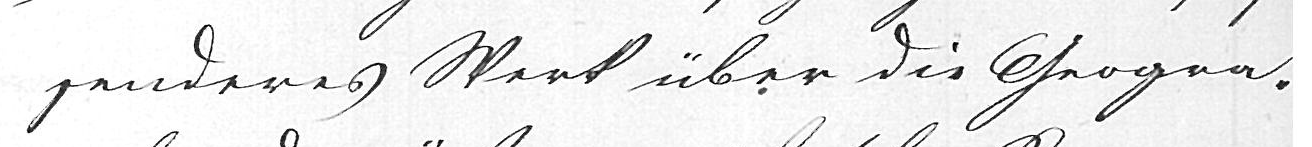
senderes Werk über die Geogra-
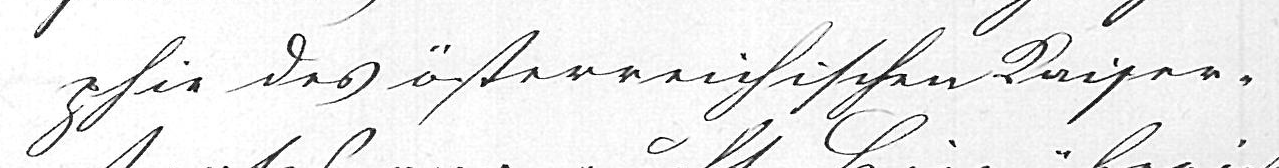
phie des österreichischen Kaiser-
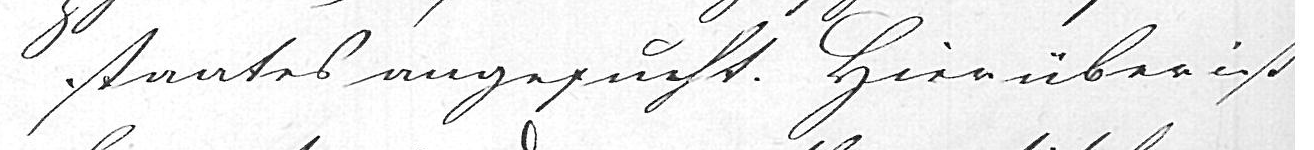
staates angesucht. Hierüber ist
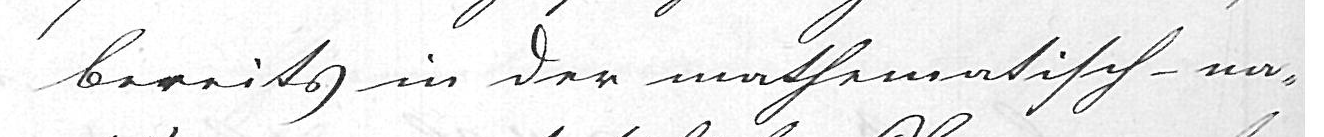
bereits in der mathematisch-na-
